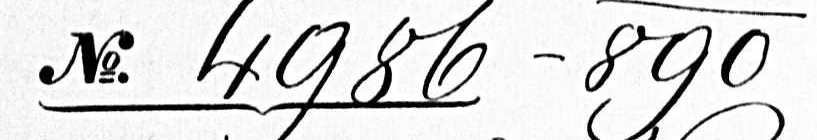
No. 4986 - 890
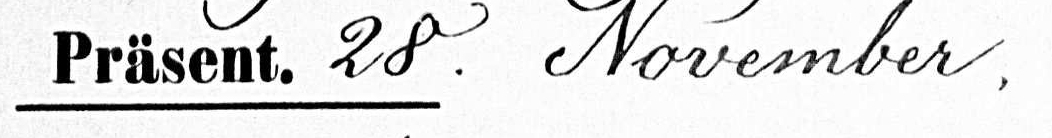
Präsent. 28. November.
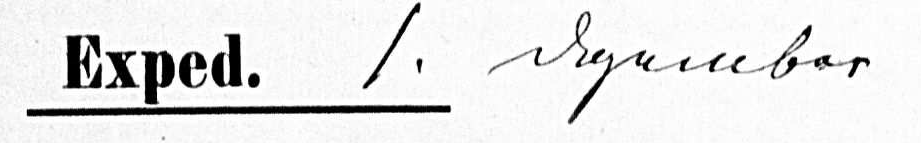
Exped. 1. Dezember.
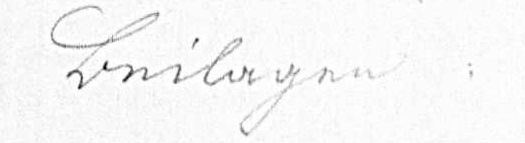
Beilagen.
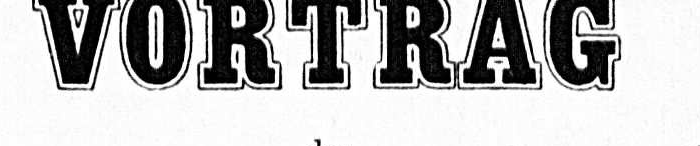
Vortrag
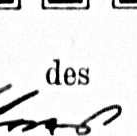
des
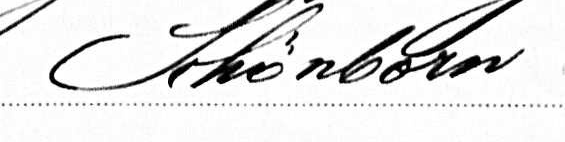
Schönborn
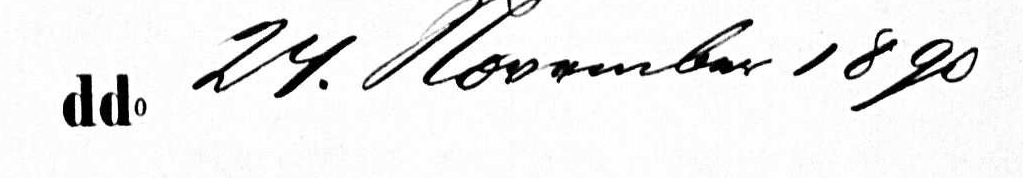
ddo 2. November 1890
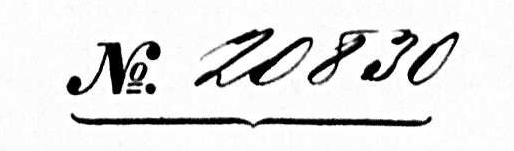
No. 20830
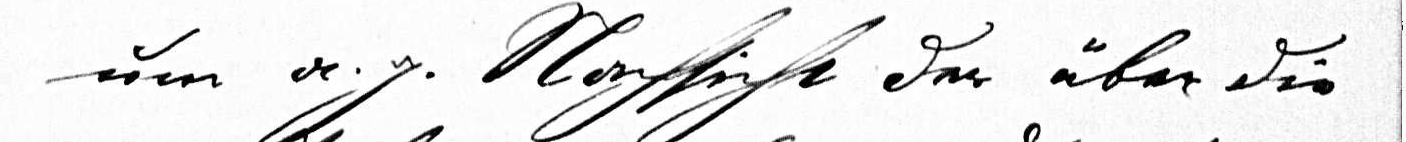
um a. g. Nachsicht der über die
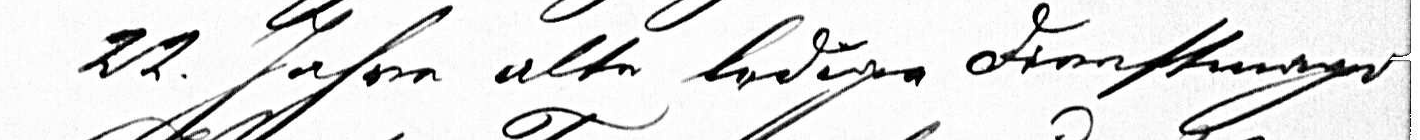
22. Jahre alte ledige Dienstmagd
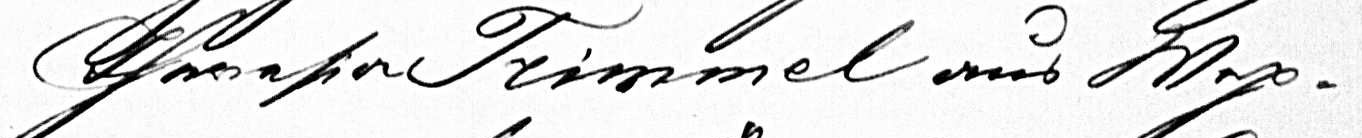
Theresia Trimmel aus Weg¬
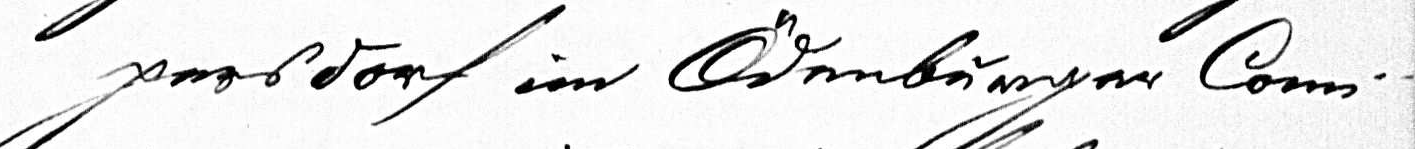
gersdorf im Ödenburger Comi¬
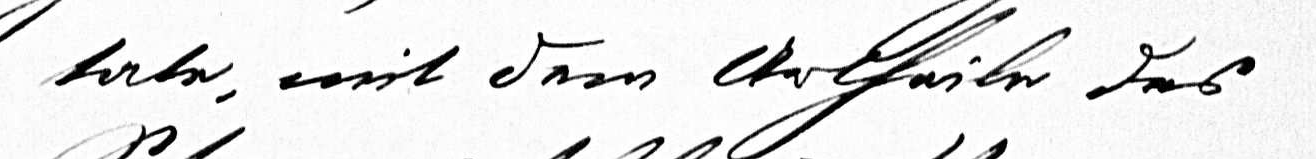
tate, mit dem Urtheile des
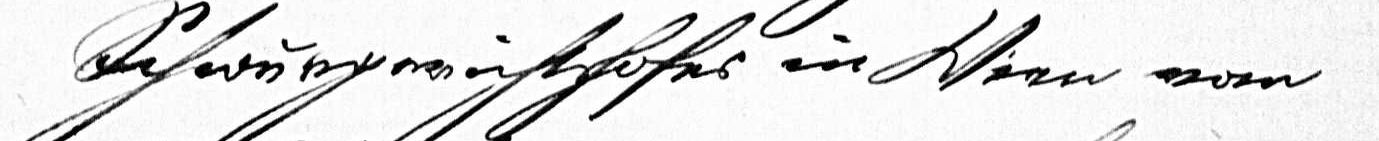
Schwurgerichthofes in Wien vom
